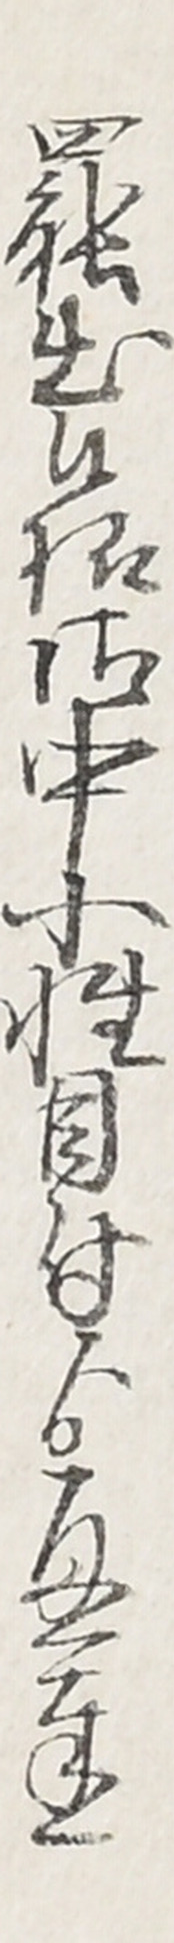罷出候様御中小性目付ゟ通達
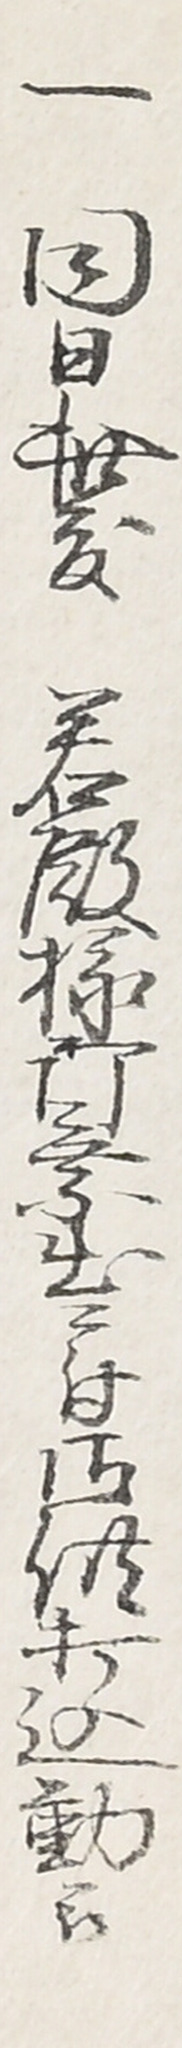一同日此度若殿様御乗出ニ付御供打込勤被
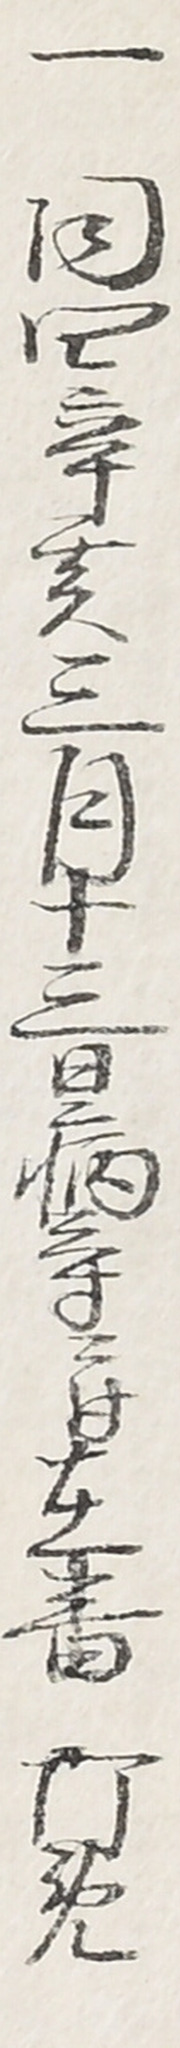一同四辛亥三月十三日病気ニ付在番御免
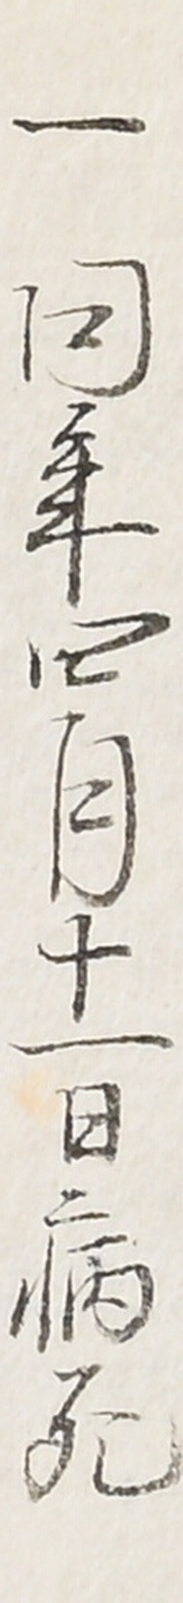一同年四月十一日病死
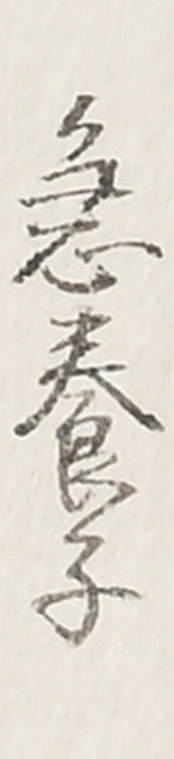急養子
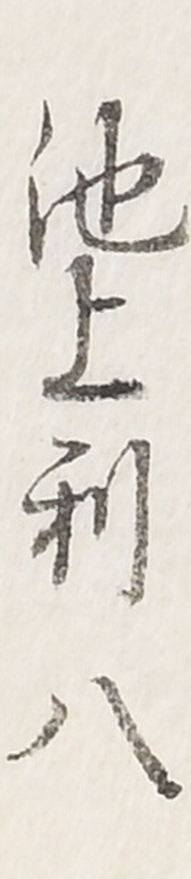池上利八
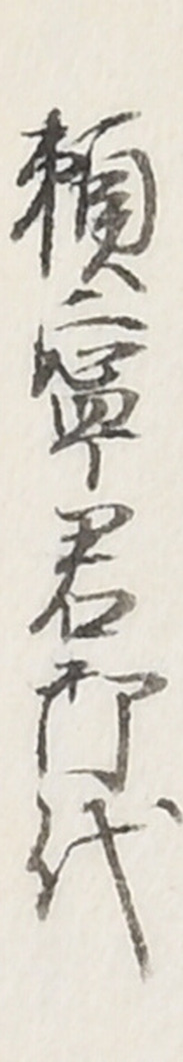頼寧君御代
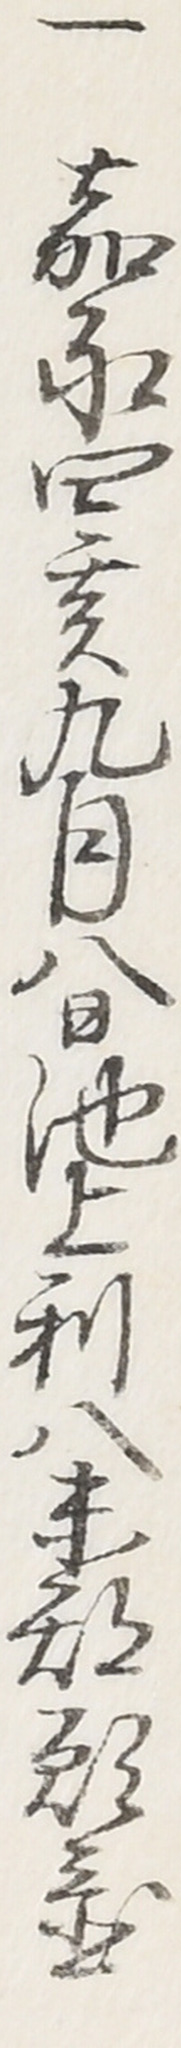一嘉永四亥九月八日池上利八末期願置
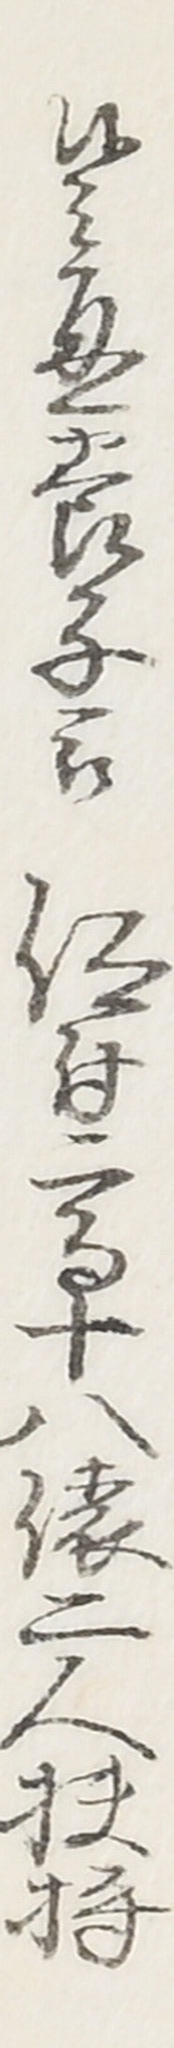候之通養子被仰付高十八俵二人扶持
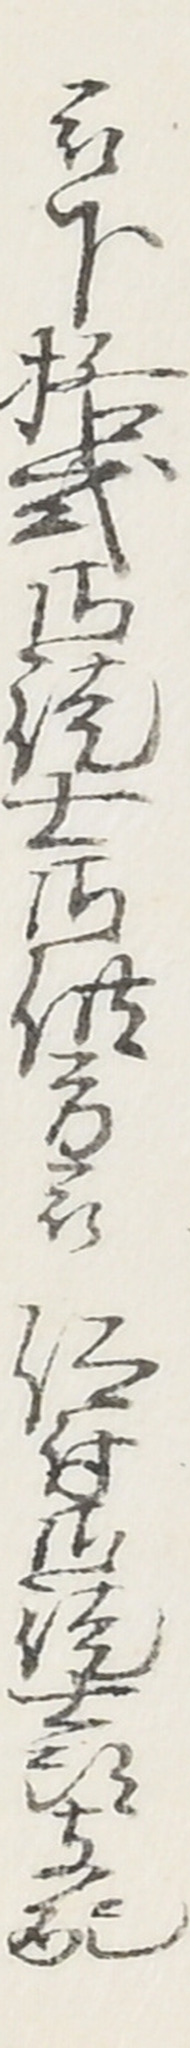被下格式御徒士御供方被仰付徒士頭支配
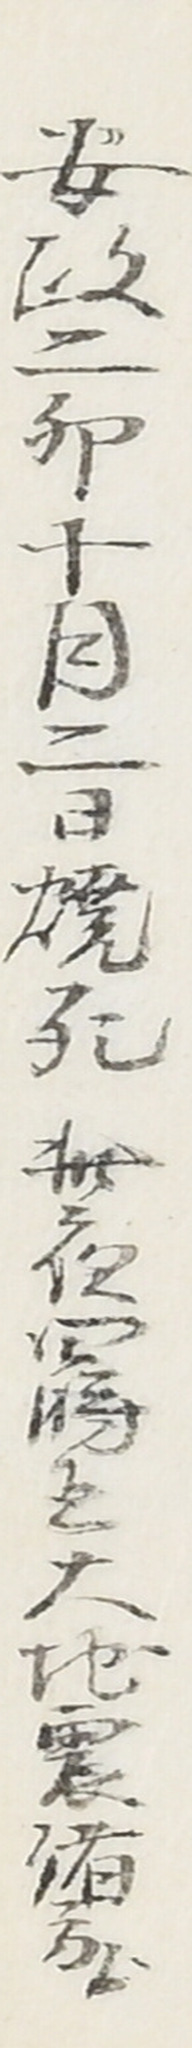一安政二卯十月二日焼死此夜四時過大地震賄方ゟ
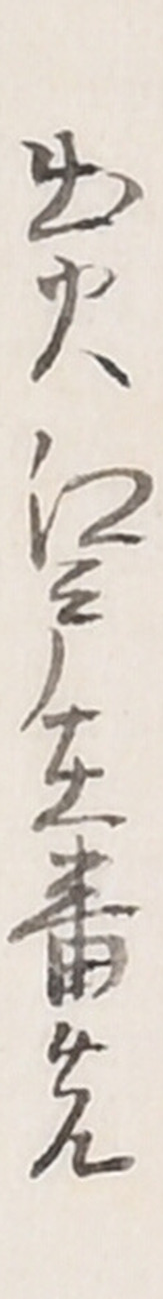出火江戸在番先
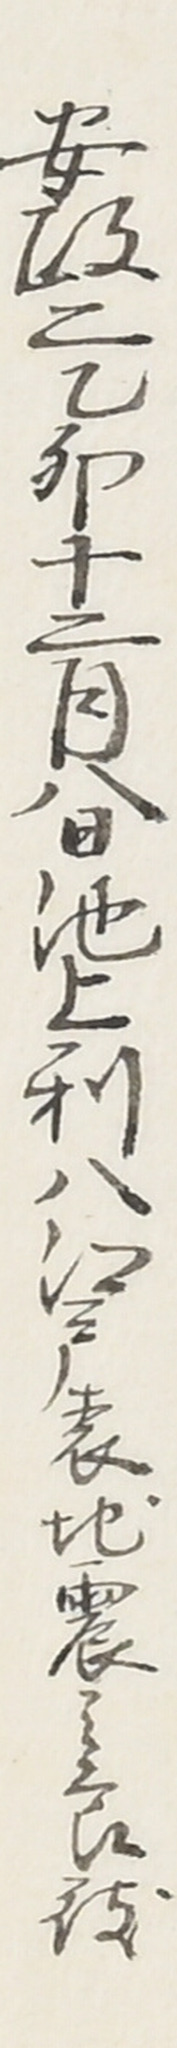一安政二乙卯十二月八日池上利八江戸表地震之節致
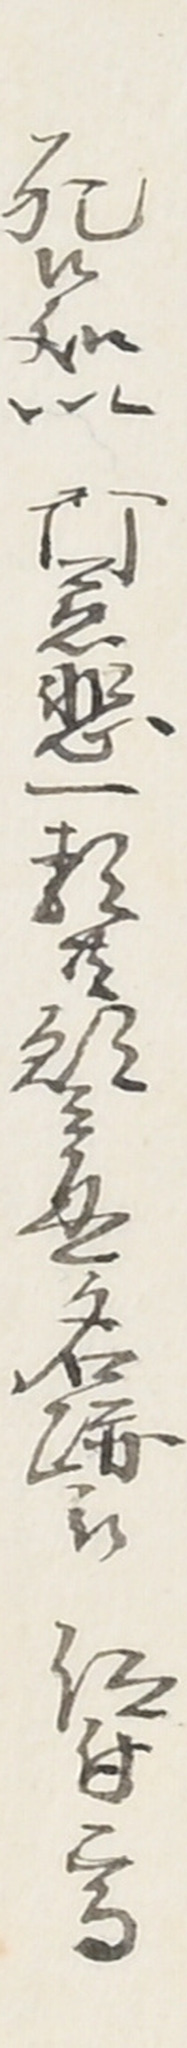死候処以御慈悲一類共願之通名跡被仰付高
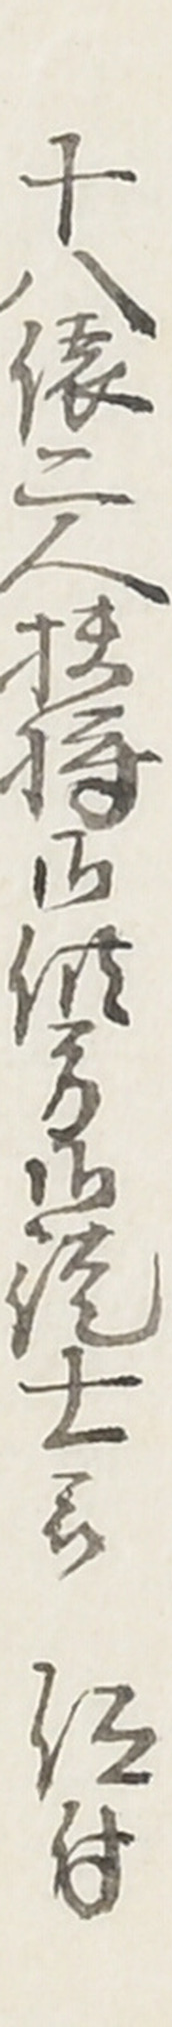十八俵二人扶持御供方御徒士被仰付

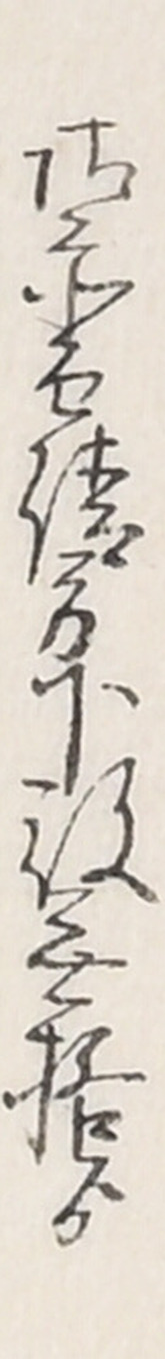御普請方下役無格ゟ
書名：無足諸士勤仕録（四）
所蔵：伊那市立高遠町図書館・合同会社AMANE
